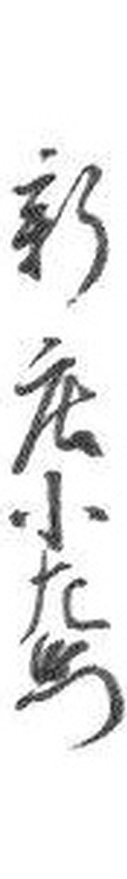新庄小左衛門
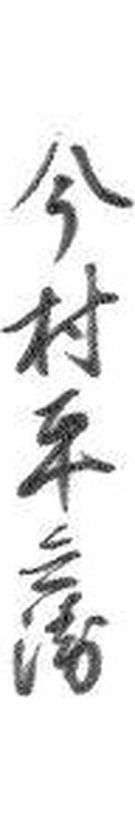今村平兵衛
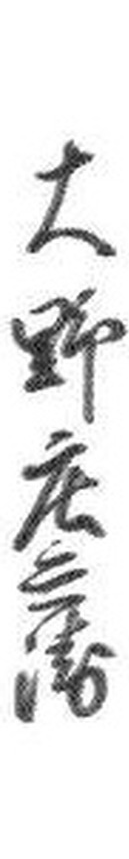大野庄兵衛
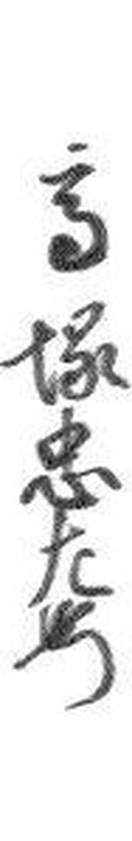高塚忠左衛門
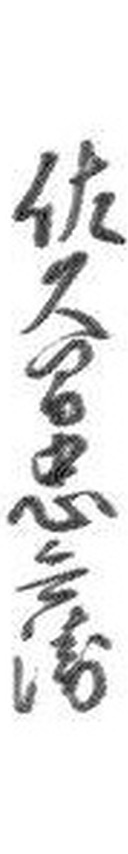佐久間忠兵衛
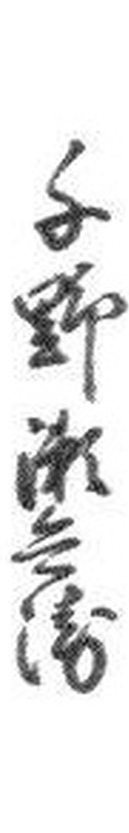牧野権兵衛
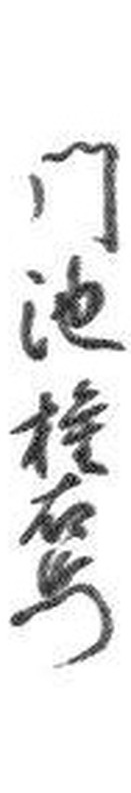門池権右衛門
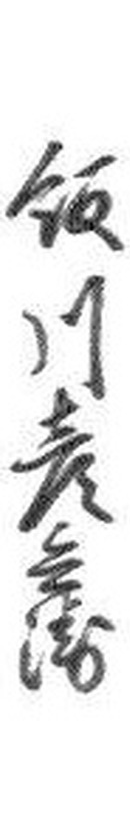飯川彦兵衛
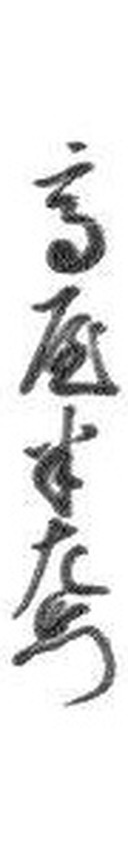高屋半左衛門

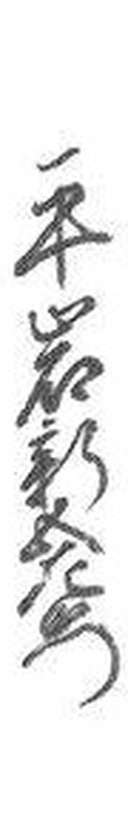平岩新五左衛門
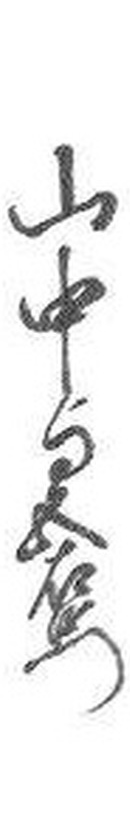山中与五右衛門
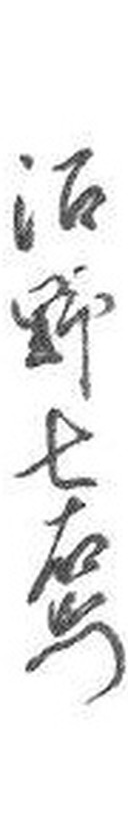沼野七右衛門
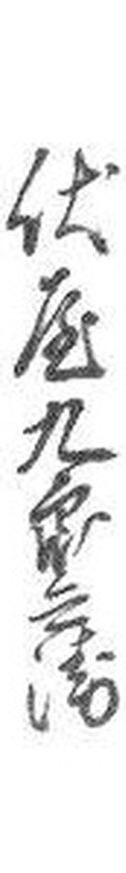伏屋九郎兵衛
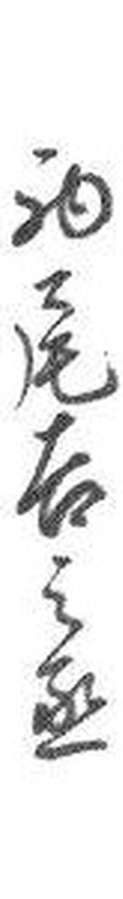西尾吉之丞
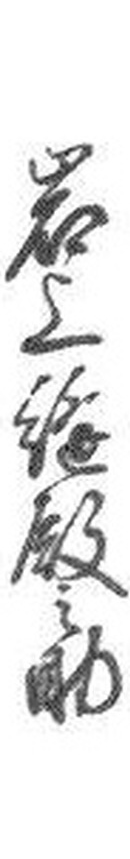岩上縫殿之助
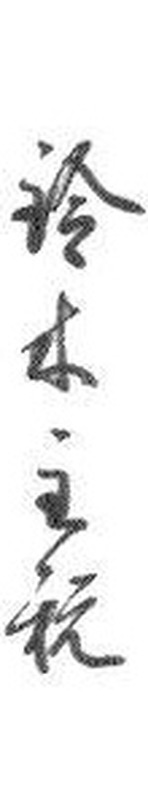鈴木主税
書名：家譜 四 忠昌公 従寛永七年到正保四年
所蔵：福井県文書館 Fukui Prefectural Archives
